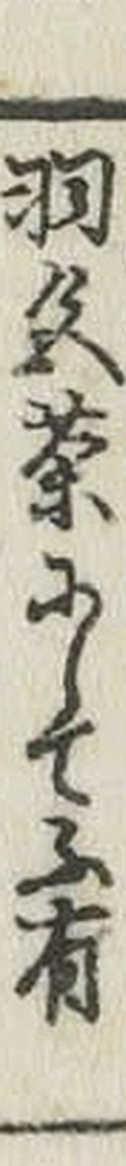羽色茶にしてふ有
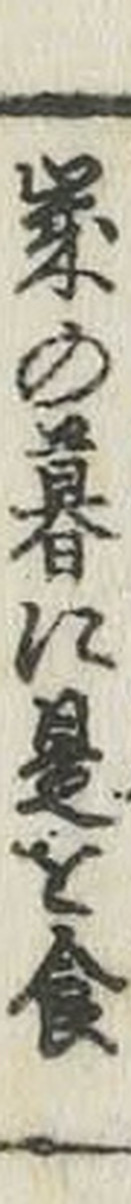歳の暮に是を食
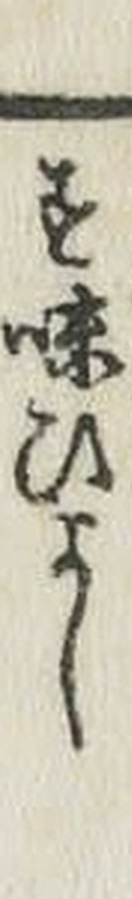す味ひよし
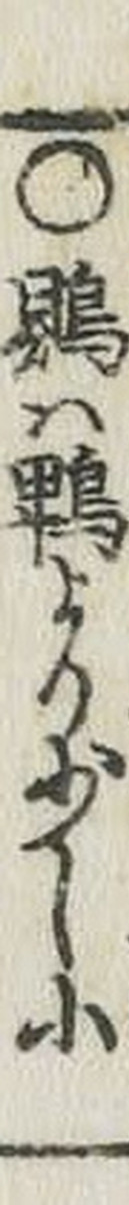○鵙は鵯より少し小
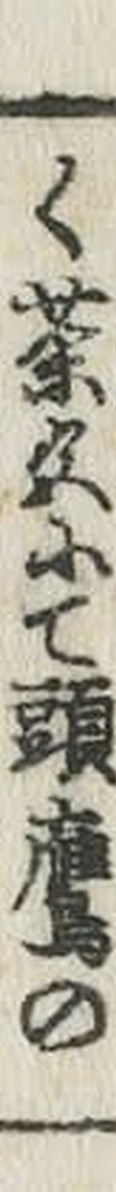く茶色にて頭鷹の
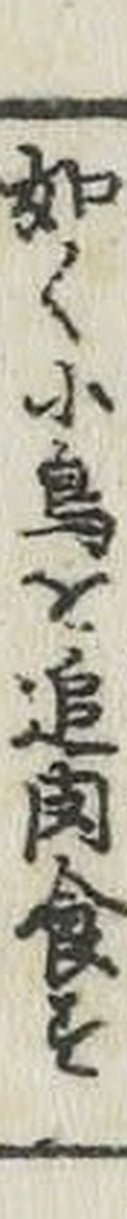如く小鳥を追肉食す
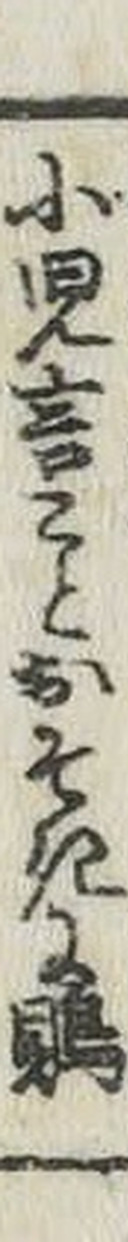小児言ことおそきに鵙
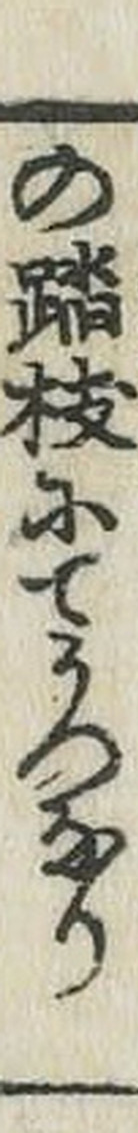の踏枝にてうつなり
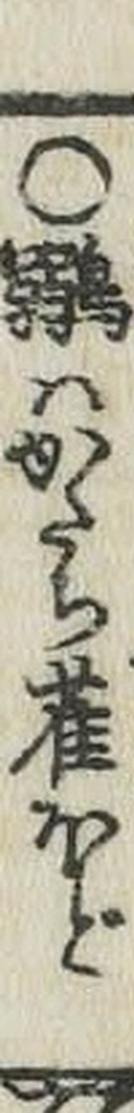○鶸はかたち雀ほど
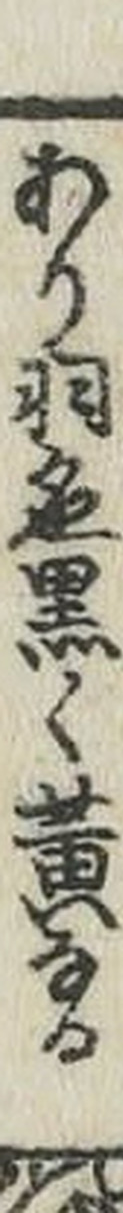あり羽色黒く黄なる
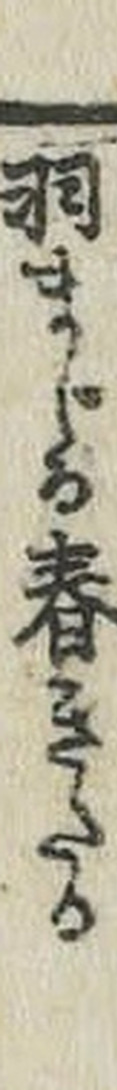羽まじる春きたる

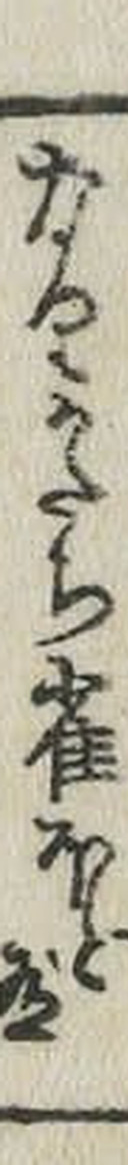なりかたち雀ほど有
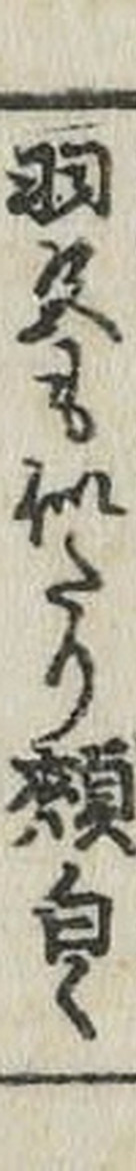羽色も似たり頬白く
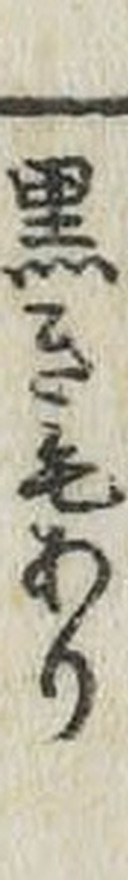黒き毛あり
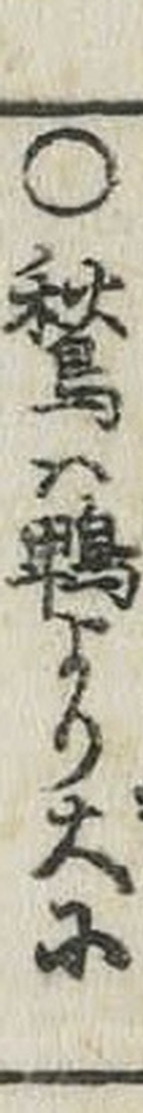○鶖は鵯より大に
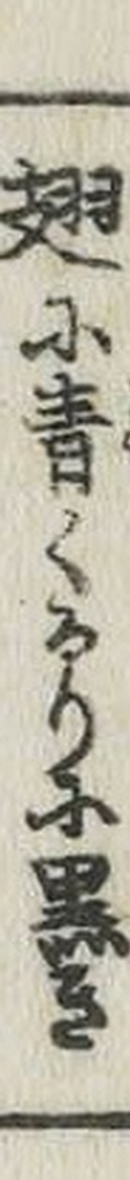翅に青くるりに黒き
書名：増補頭書訓蒙図彙大成 10巻 6:巻之12-13
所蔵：東京学芸大学教育コンテンツアーカイブ
